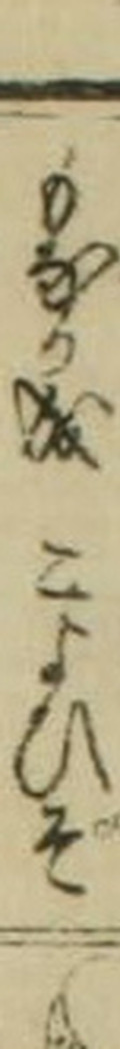もなか成こよひぞ
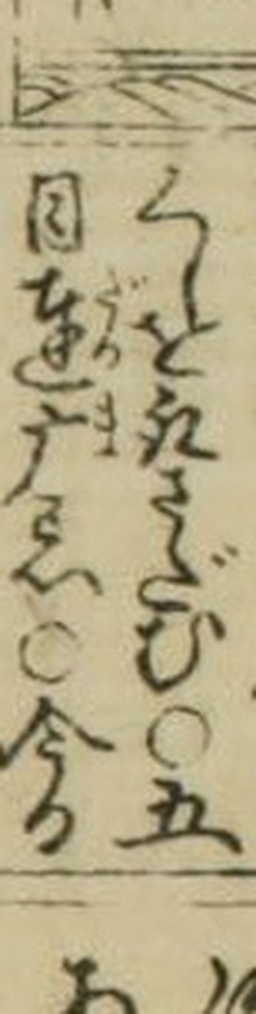日達磨忌○今日
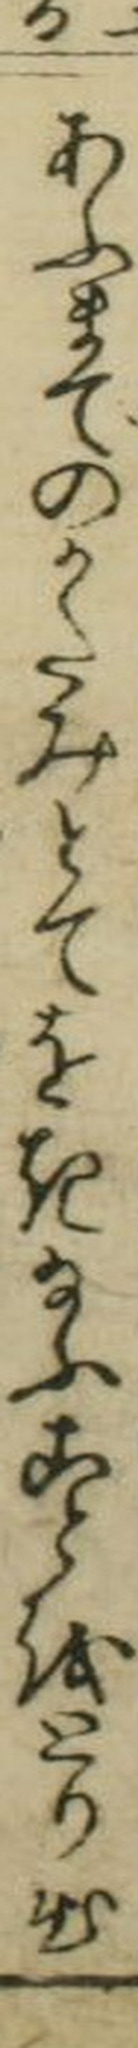あふまでのかたみとてをき給ふことをとり出
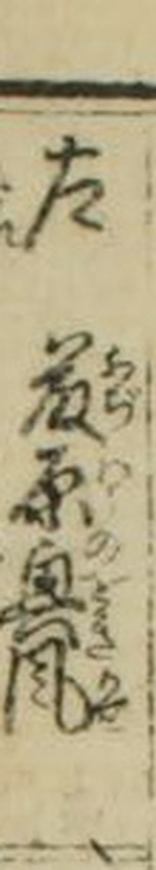左藤原興風
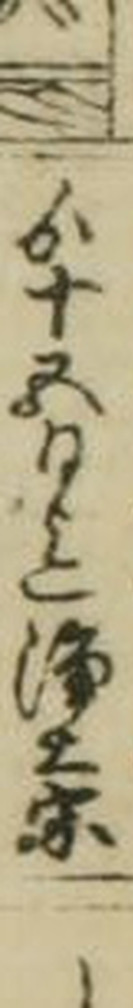より十五日迄浄土宗
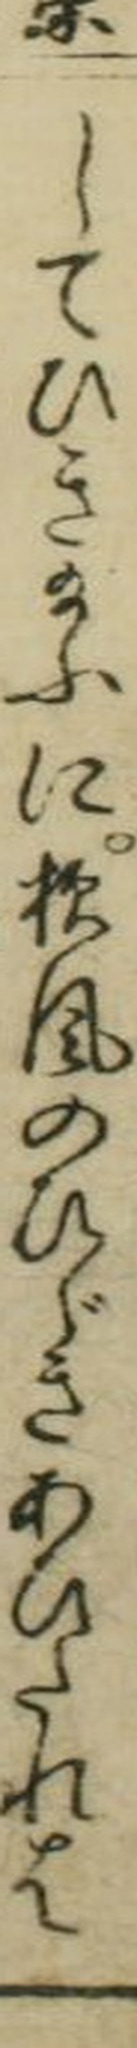してひき給うに。まつ風のひゞきあひたれは
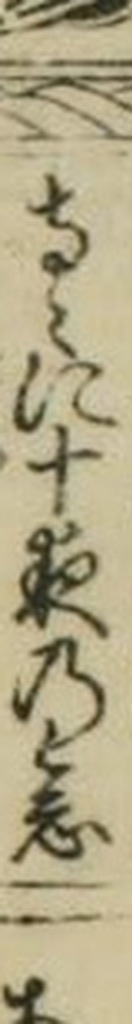寺々に十夜の念
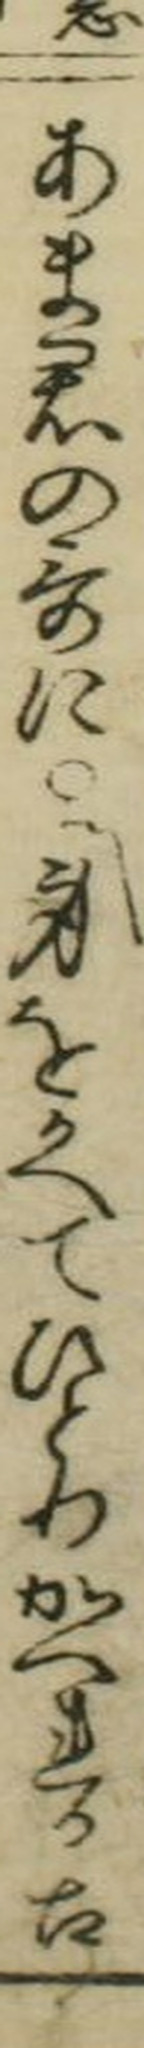あま君の哥に◯〽身をかへてひとりかへれる古
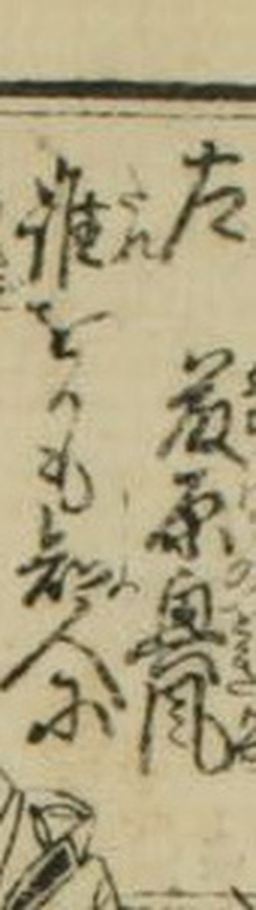誰をかも知人に
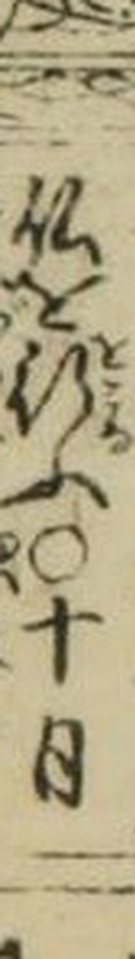仏を行ふ○十日
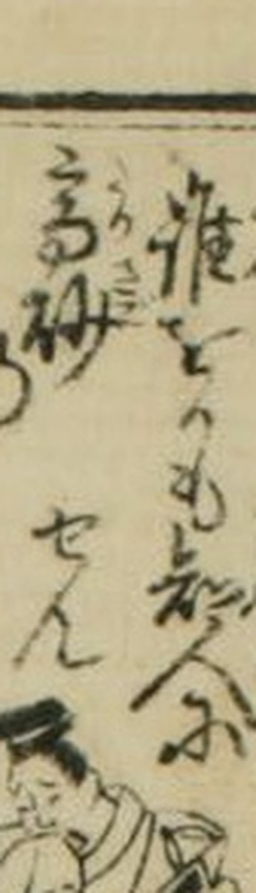高砂せん
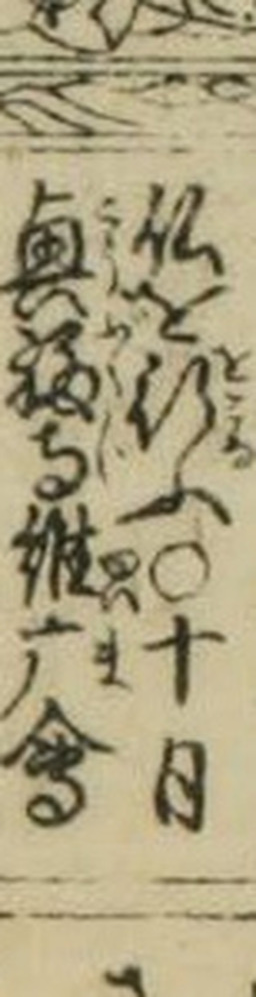興福寺維摩会
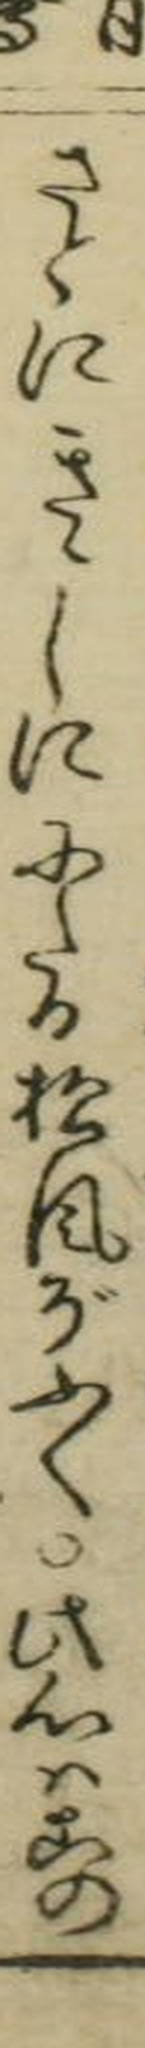さとにきゝしににたるまつ風ぞふく○此心はこの
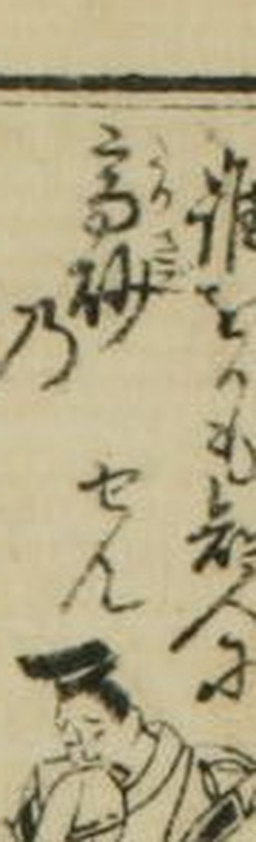高砂せん
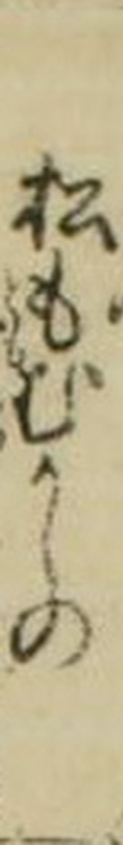松もむかしの
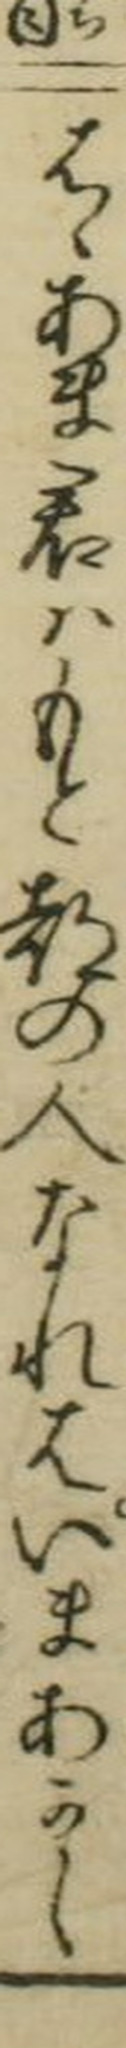はゝあま君はもと都の人なれは。いまあかし
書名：女源氏教訓鑑
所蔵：東京学芸大学附属図書館
